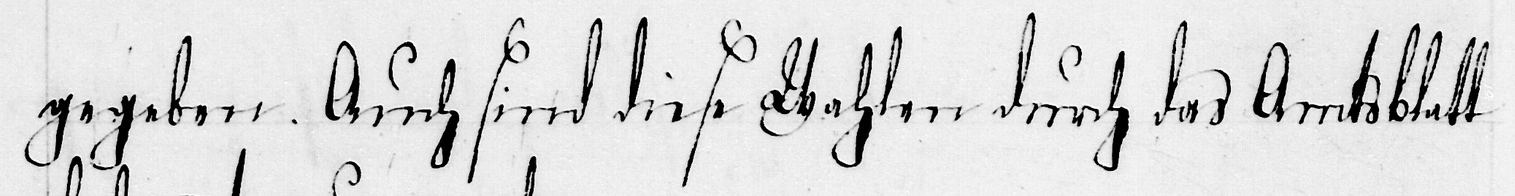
gegeben. Auch sind diese Wahlen durch das Amtsblatt
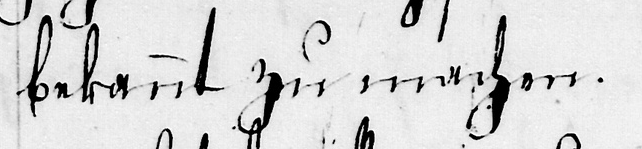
bekannt zu machen.
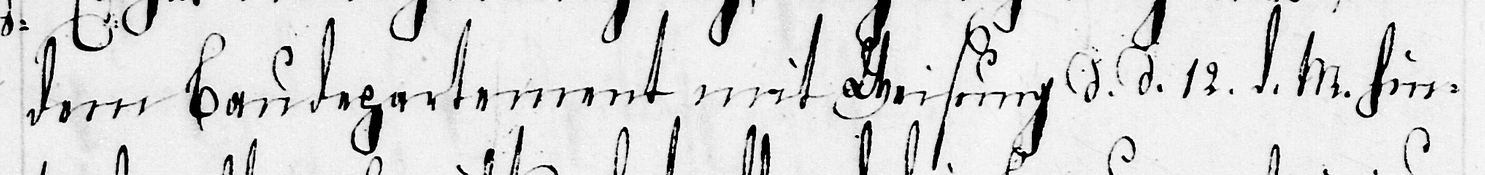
dem Baudepartement mit Weisung d. d. 12. d. M. hin¬
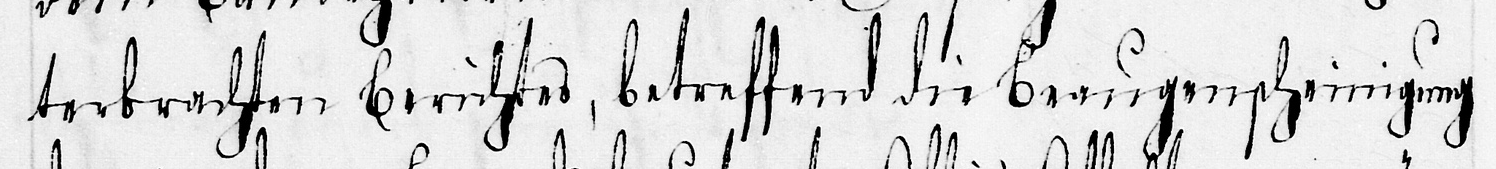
terbrachten Berichtes, betreffend die Beaugenscheinigung
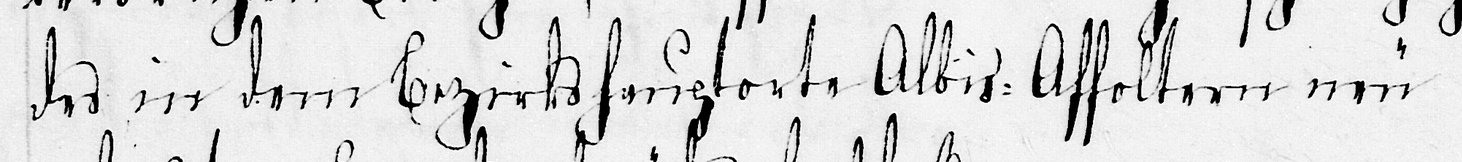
des in dem Bezirkshauptorte Albis-Affoltern neu
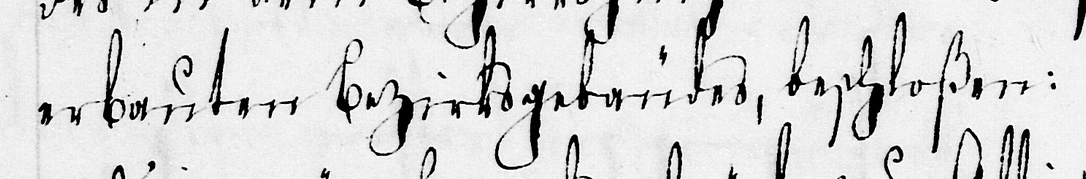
erbauten Bezirksgebäudes, beschloßen:
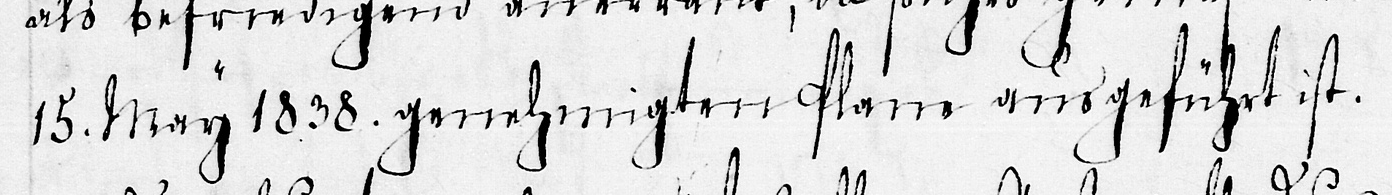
15. May 1838. genehmigten Plane ausgeführt ist.
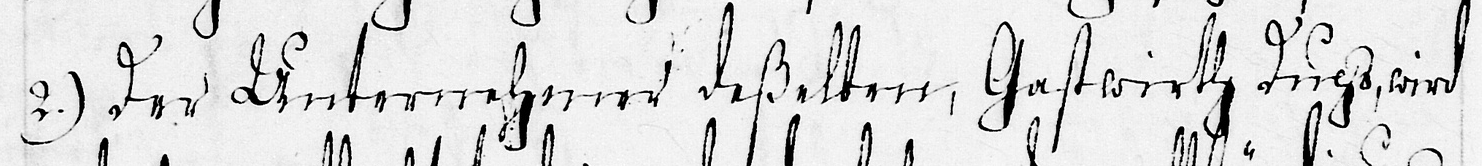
2.) Der Unternehmer deßelben, Gastwirth Dups, wird
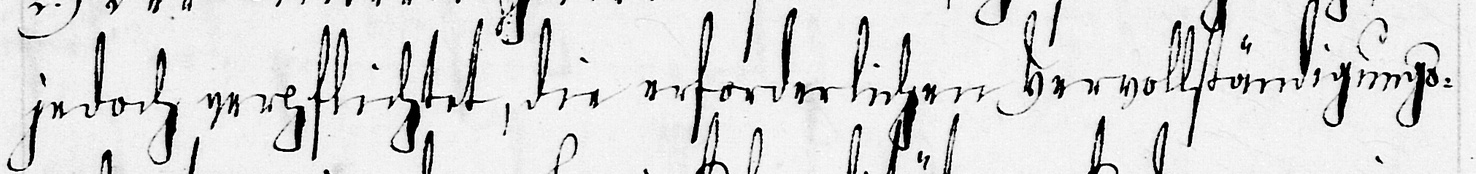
jedoch verpflichtet, die erforderlichen Vervollständigungs¬
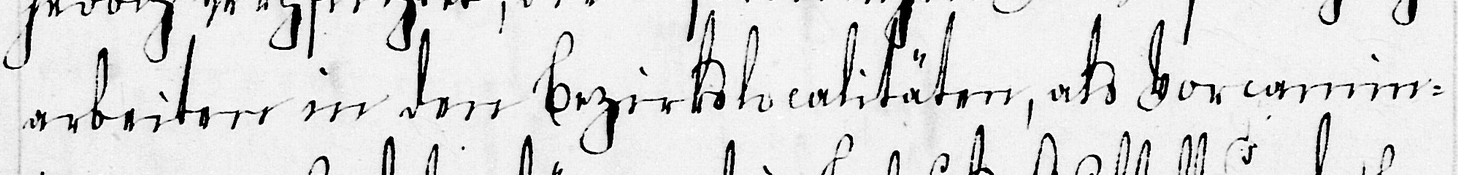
arbeiten in den Bezirkslocalitäten, als Vorcamin¬
